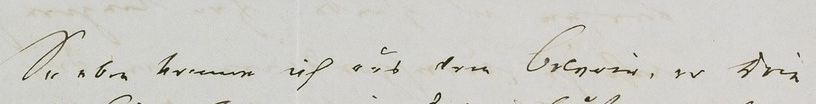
So eben komme ich aus dem Belvoir, wo Dein
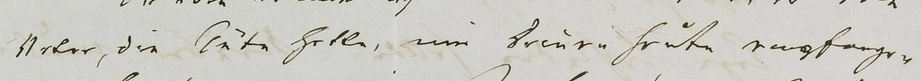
Vater, die Güte hatte, mir Deinen heute empfange-
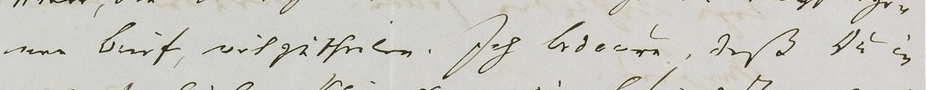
nen Brief, mitzutheilen. Ich bedaure, daß Du in
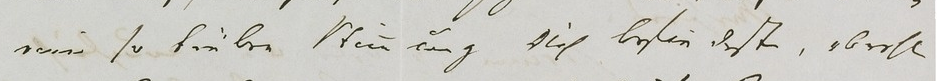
einer so trüben Stimmung Dich befindest, obwohl
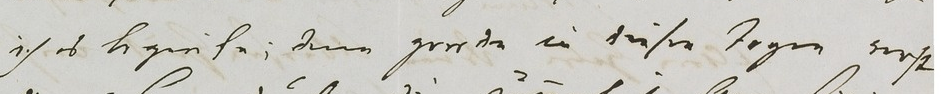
ich es begreife; denn gerade in diesen Tagen warst
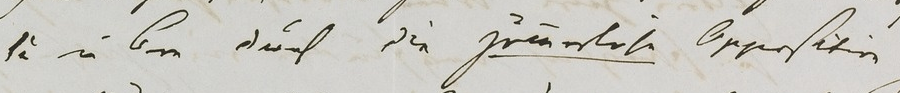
Du in Bern durch die jämmerliche Opposition
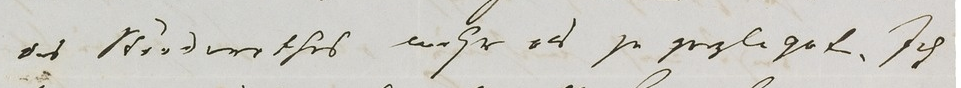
des Ständerathes mehr als je geplaget. Ich
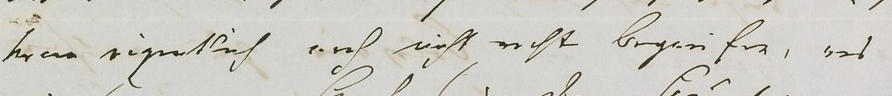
kann eigentlich noch nicht recht begreifen, was
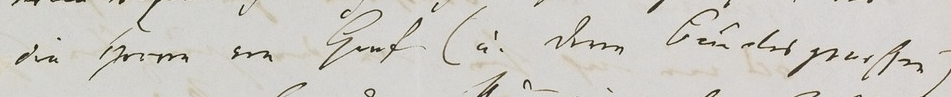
die Herren von Genf (u. deren Bundesgenossen)
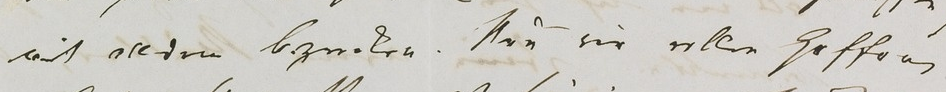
mit all dem bezwecken. Nun wir wollen hoffen,
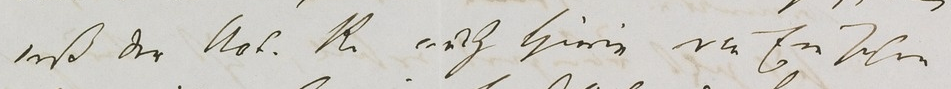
daß der Nat.R. auch hierin ein Einsehen
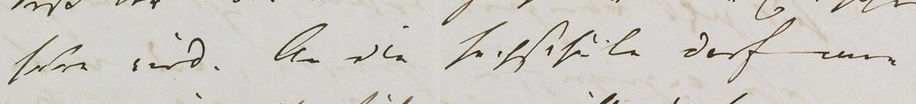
haben wird. An die Hochschule darf man
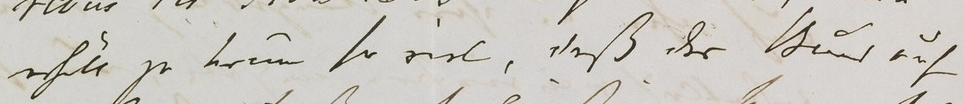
erhält ja kaum so viel, daß der Bund auf
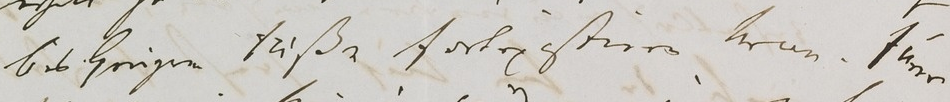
bisherigem Fuße fortexistiren kann. Furrer
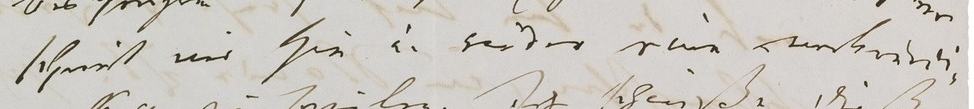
scheint mir hin u. wieder eine merkwürdi-
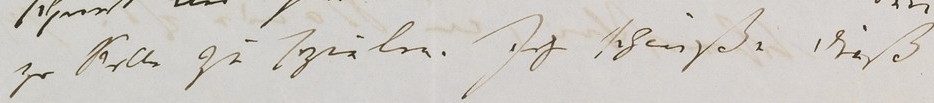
ge Rolle zu spielen. Ich schließe
